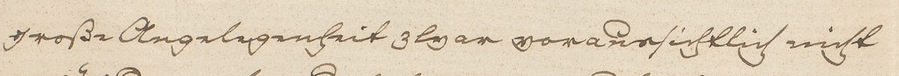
große Angelegenheit zwar voraussichtlich nicht
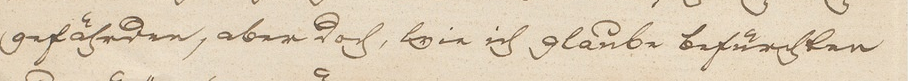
gefährden, aber doch, wie ich glaube befürchten
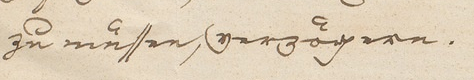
zu müssen, verzögern.
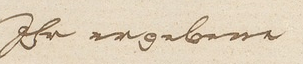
Ihr ergebene
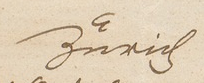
Zürich
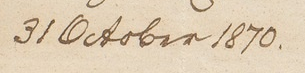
31 October 1870.
